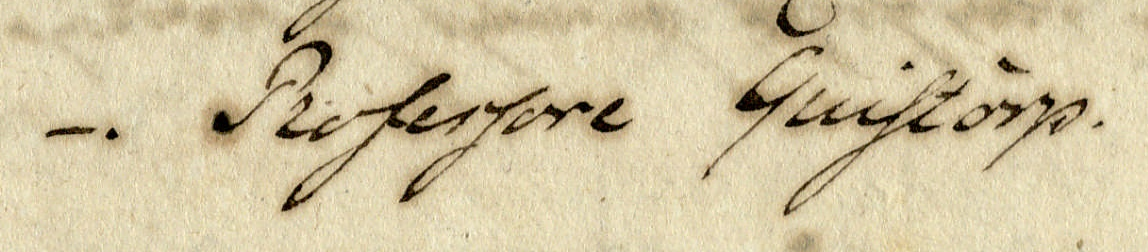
Professore Quistorp.
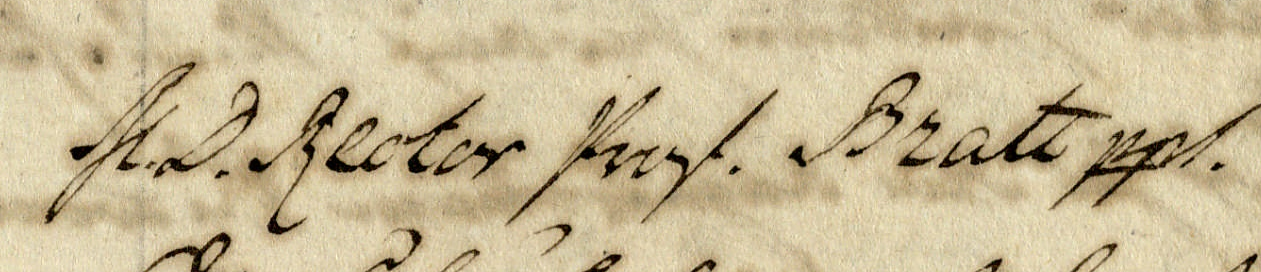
M. D. Rector Prof. Bratt ppt.
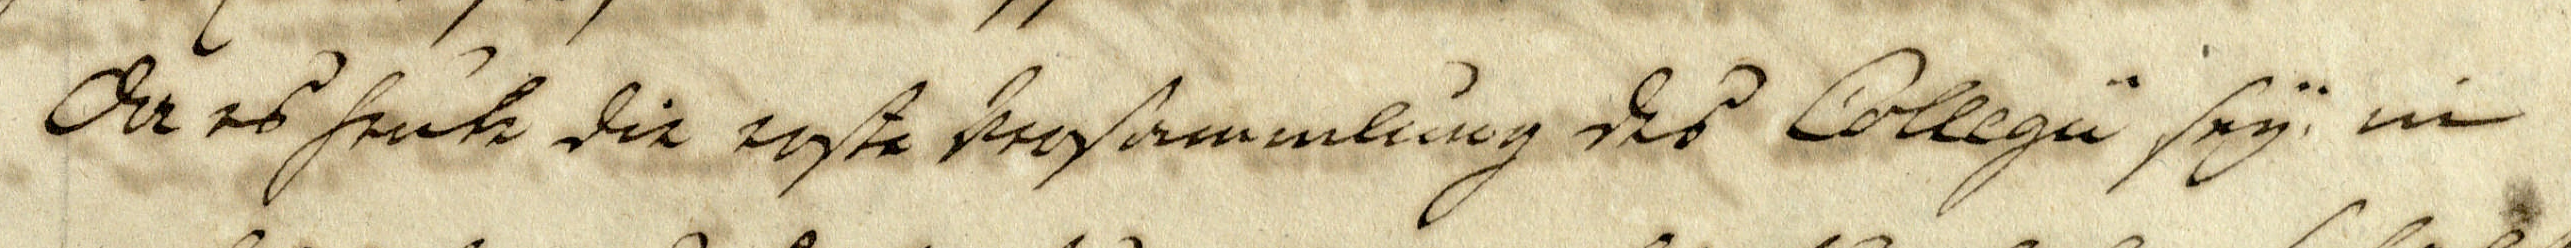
Da es heute die erste Versammlung des Collegii seÿ, in
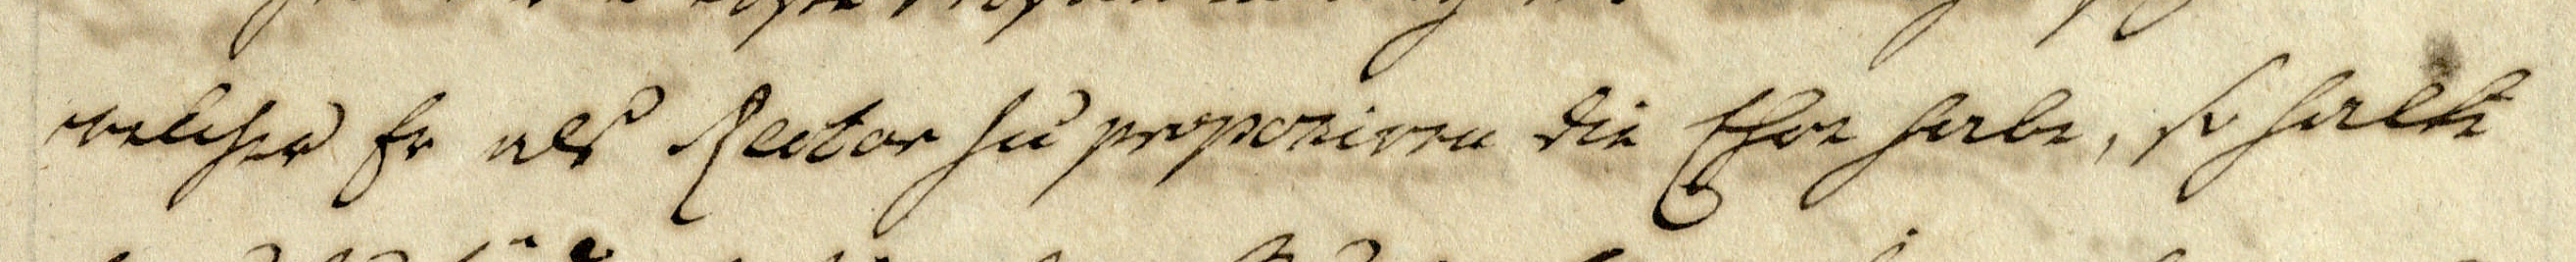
welcher Er als Rector zu proponiren die Ehre habe, so halte
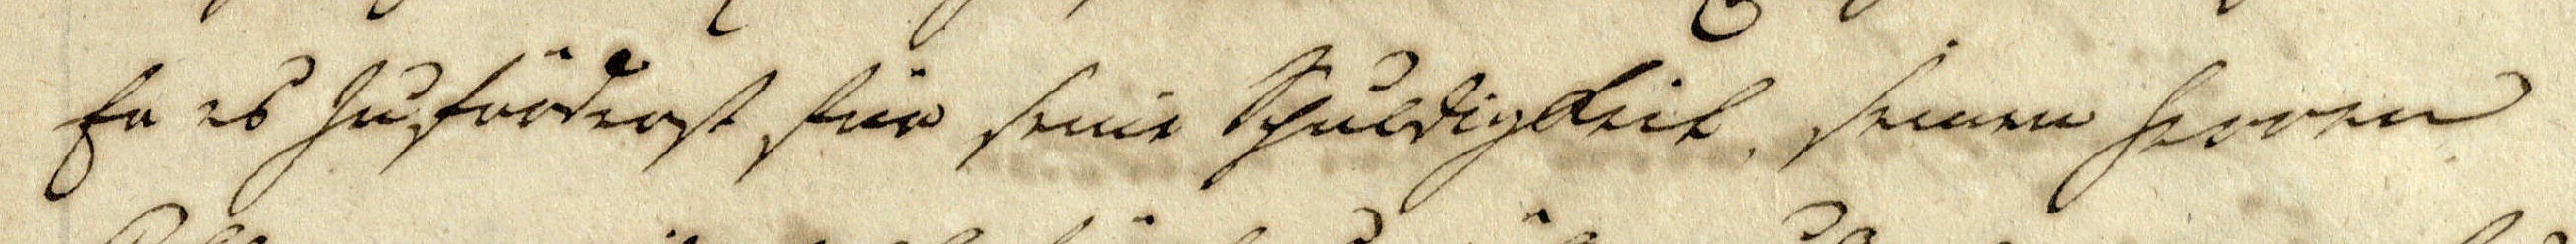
Er es zuförderst für seine Schuldigkeit, seinen Herren
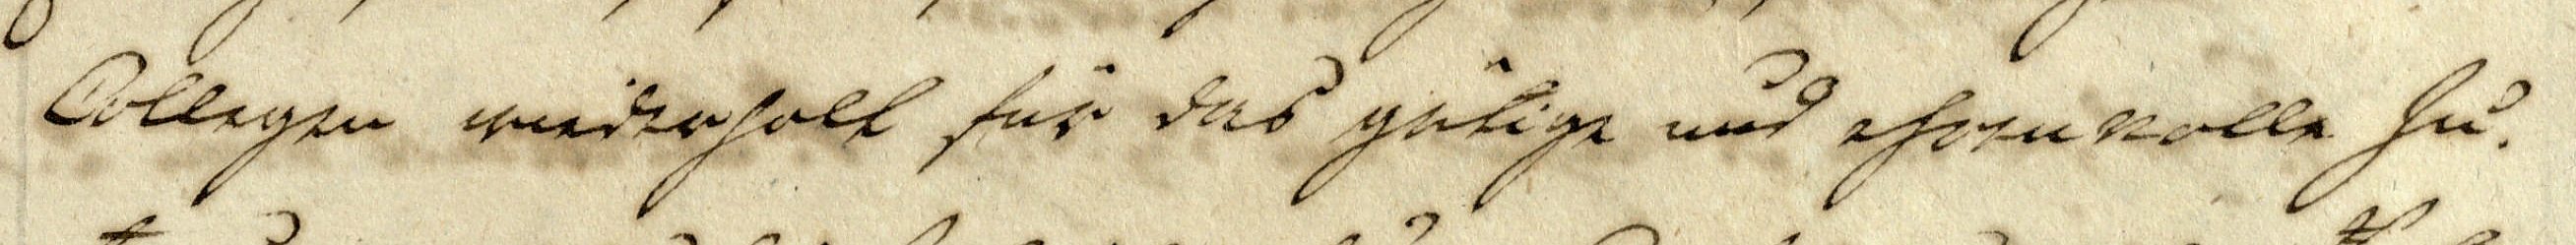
Collegen wiederholt für das gütige und ehrenvolle Zu¬
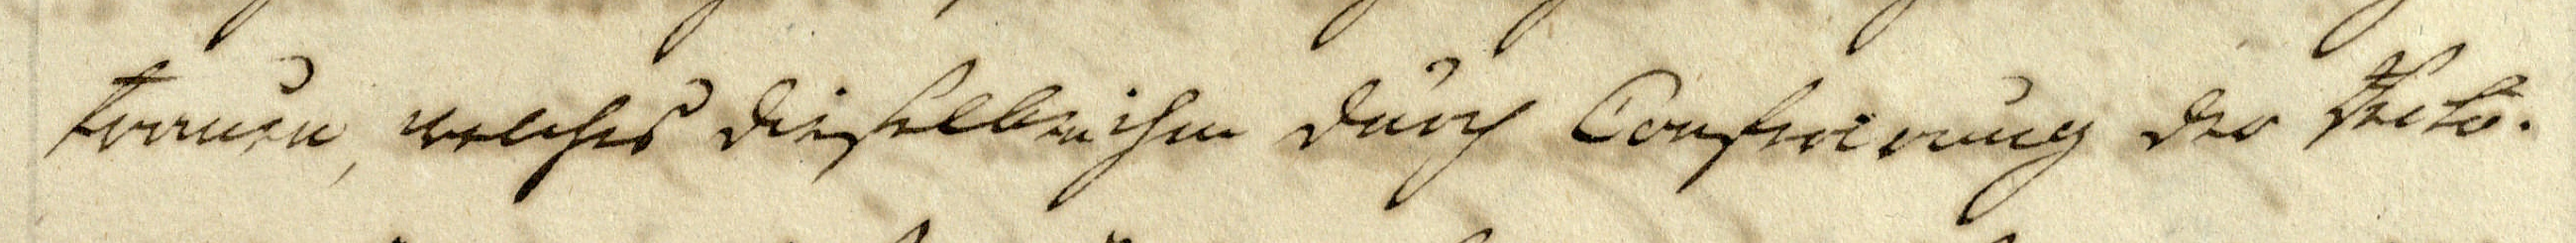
trauen, welches dieselben ihm durch Conferirung der Recto¬
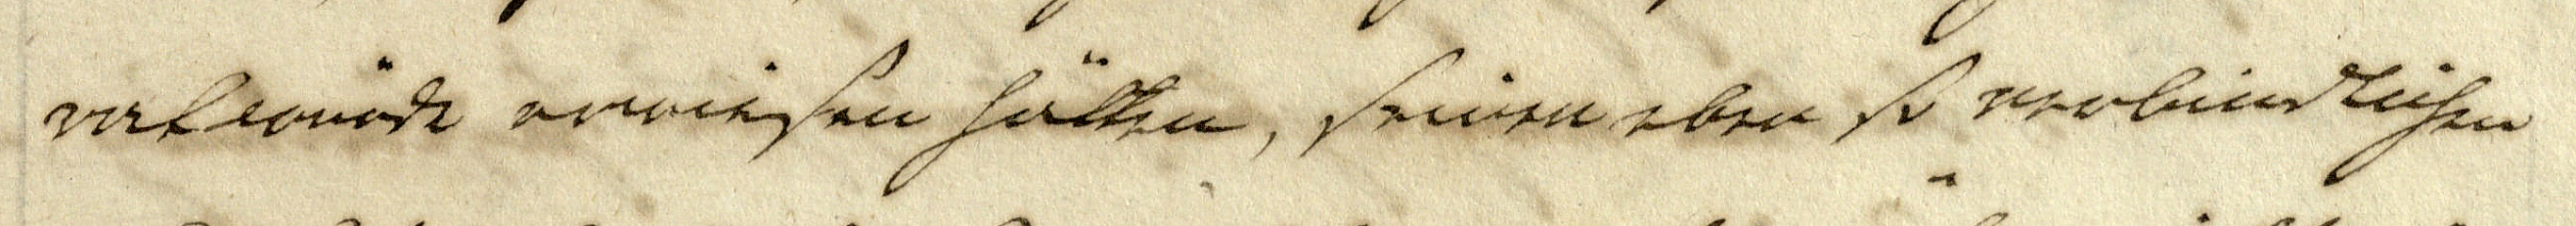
ratwürde erwiesen hätten, seinen eben so verbindlichen
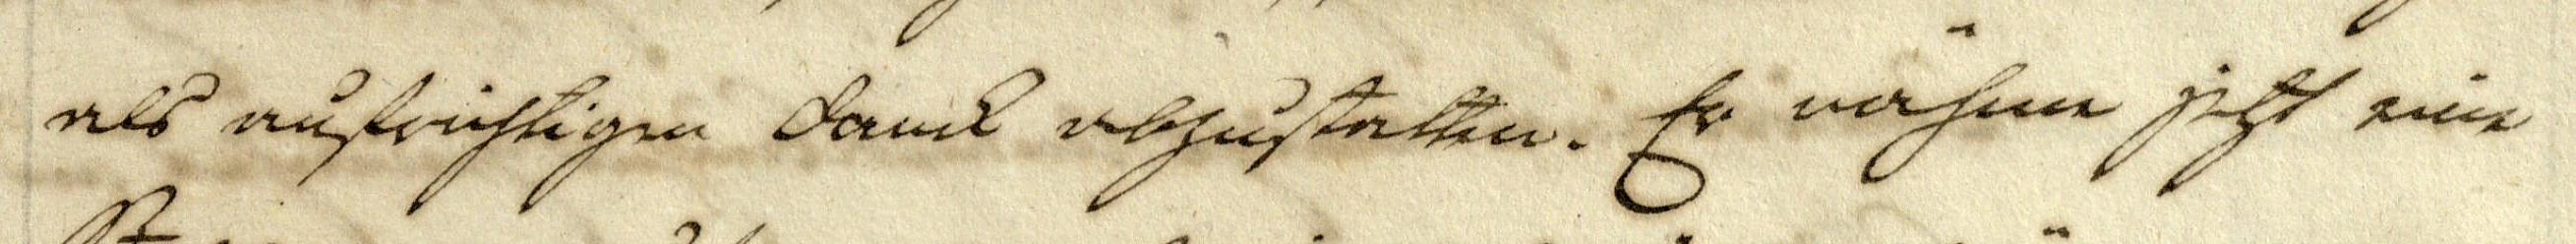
als aufrichtigen Danck abzustatten. Er nähme jetzt eine
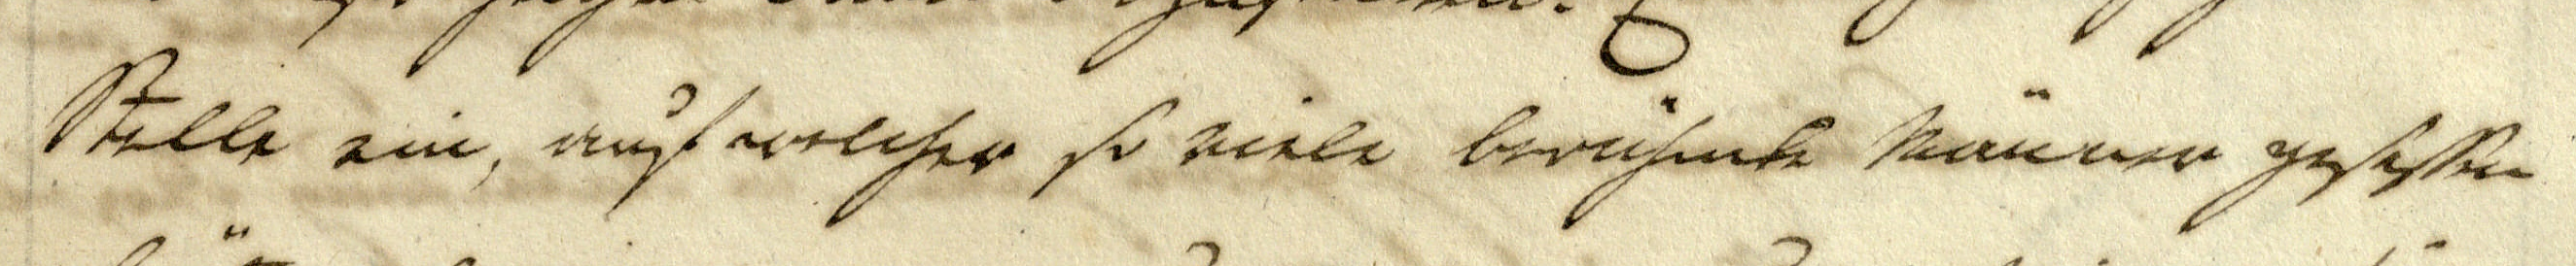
Stelle ein, auf welcher so viele berühmte Männer gesessen
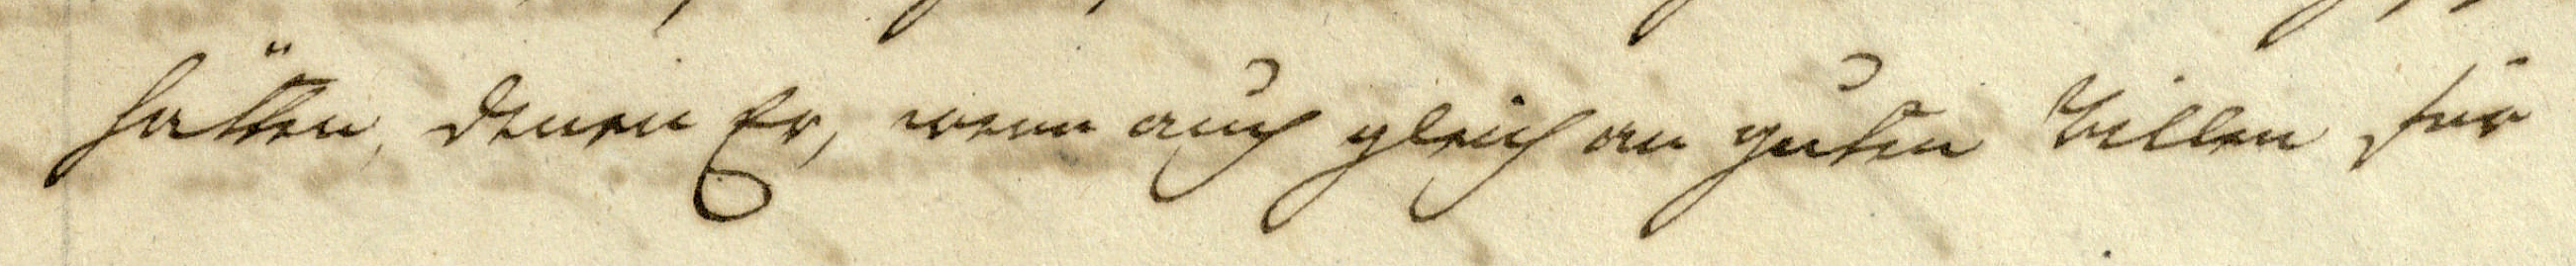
hätten, denen Er, wenn auch gleich an guten Willen für
